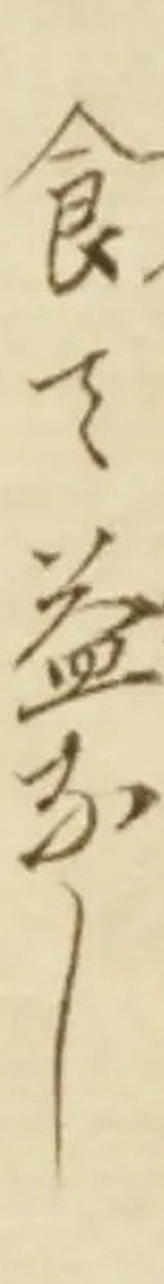食て益なし
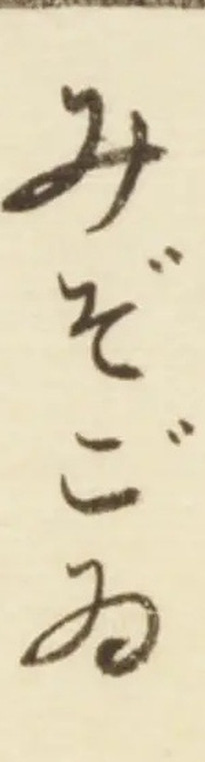みぞごゐ

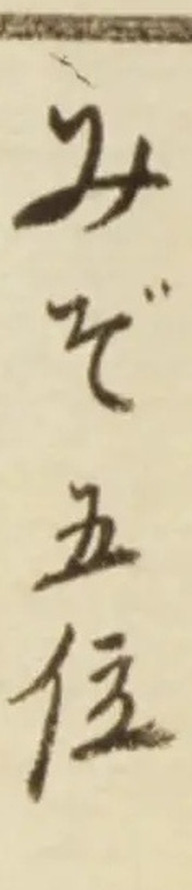みぞ五位
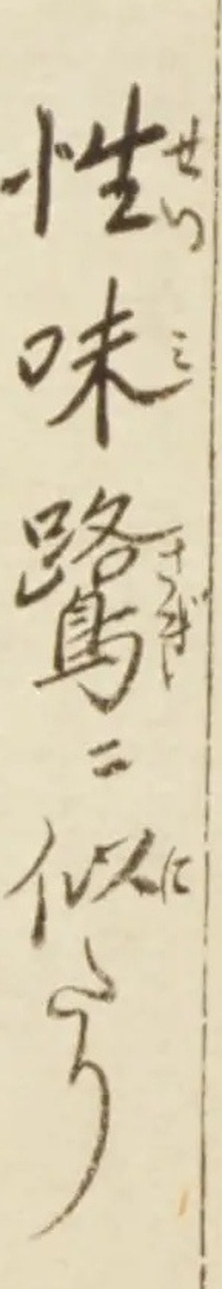性味鷺に似たり

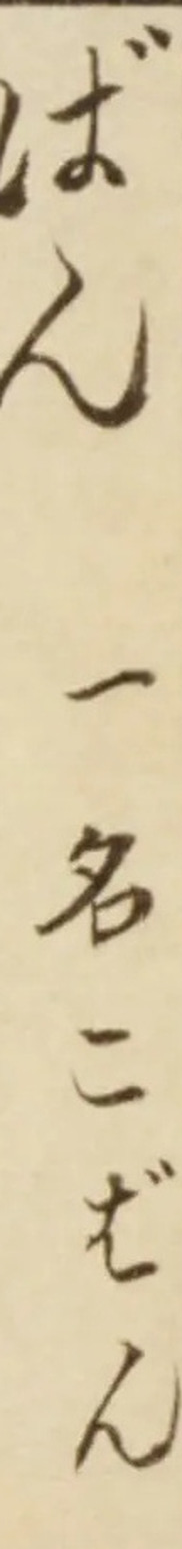ばん一名こばん
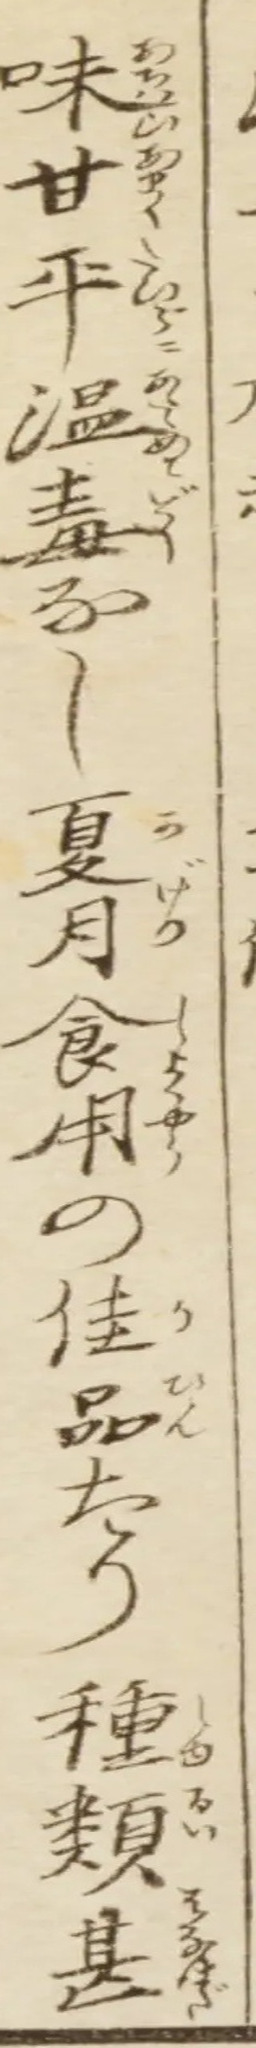味甘平温めて）毒なし夏月食用の佳品たり種類甚
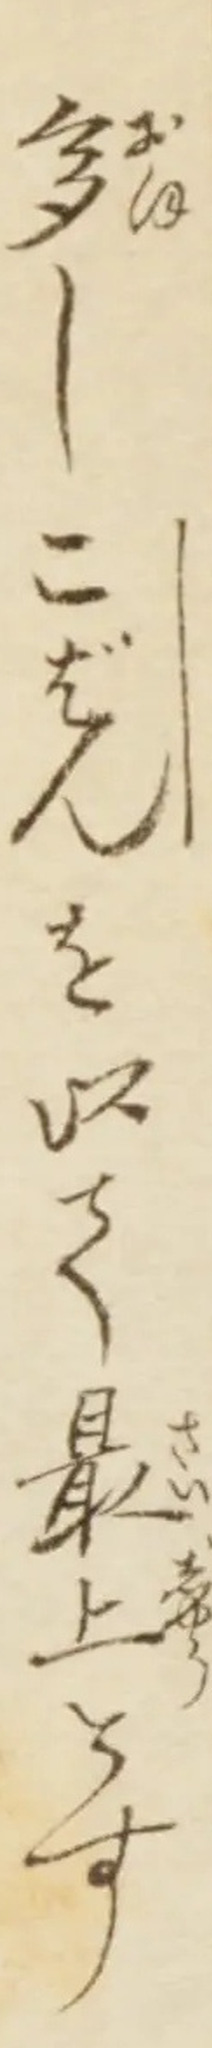多しこばんを以て最上とす
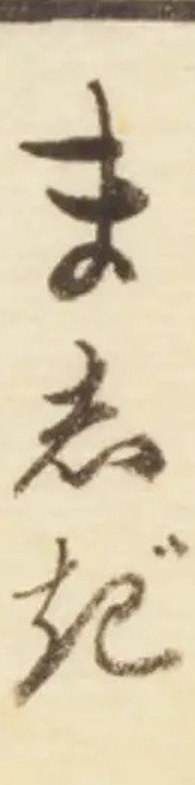ましぎ

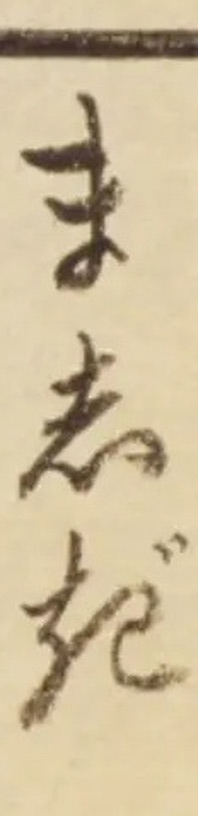ましぎ
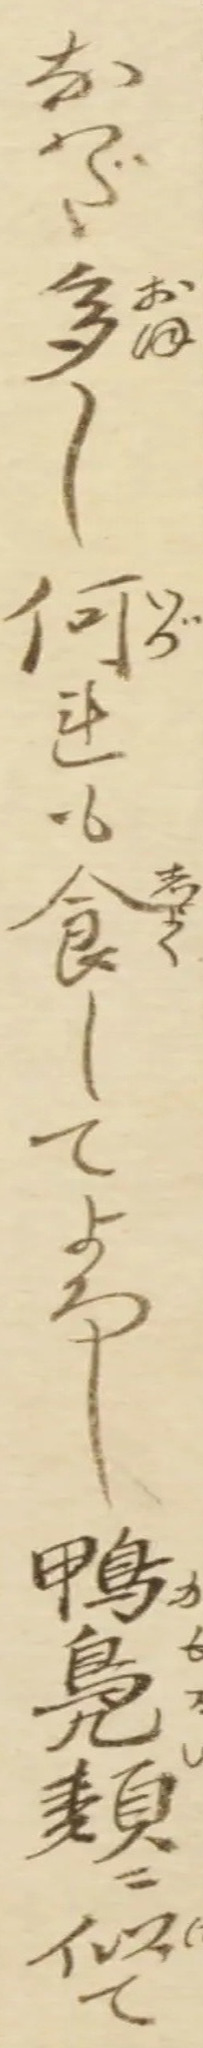なはだ多し何れも食してよろし鴨鳧類に似て
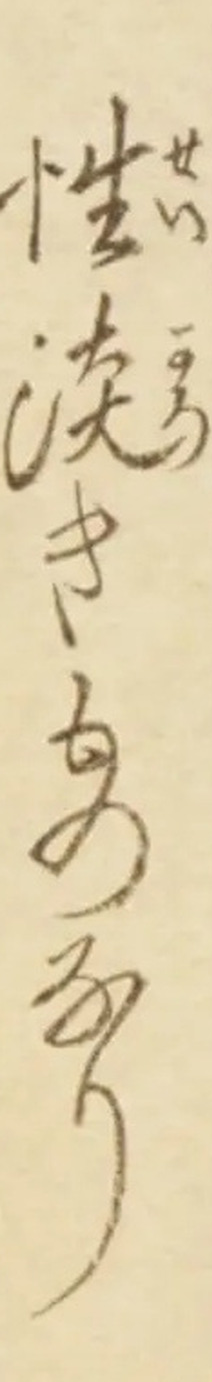性淡きものなり
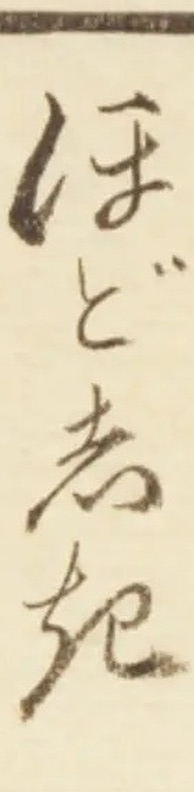ほどしき

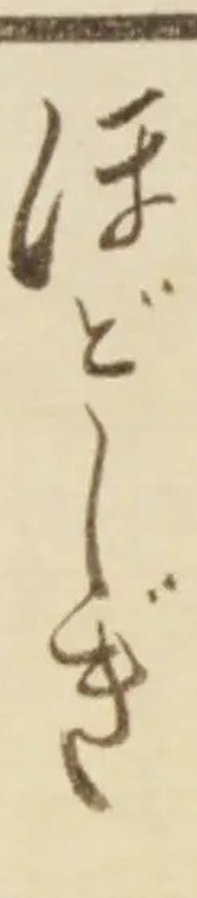ほどしぎ
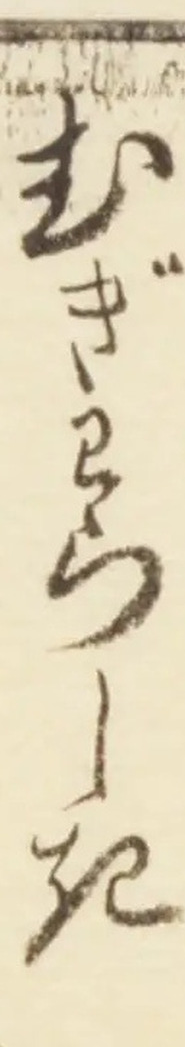むぎわらしき

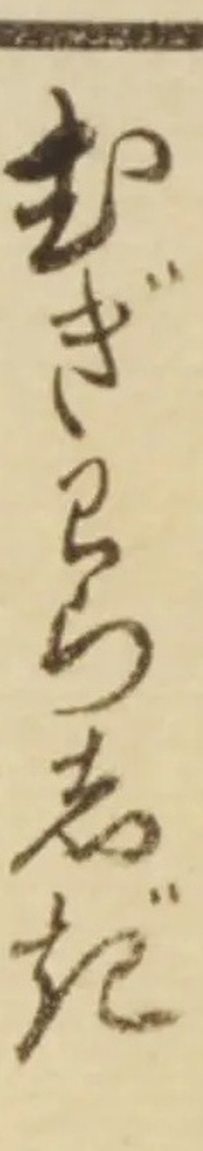むぎわらしぎ
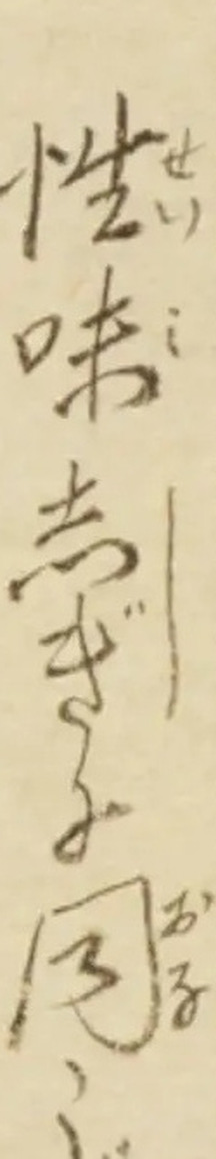性味しぎに同じ
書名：華鳥譜
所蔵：国立国会図書館 National Diet Library, JAPAN
